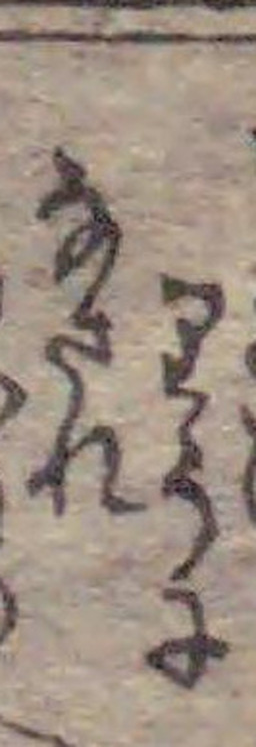なされ
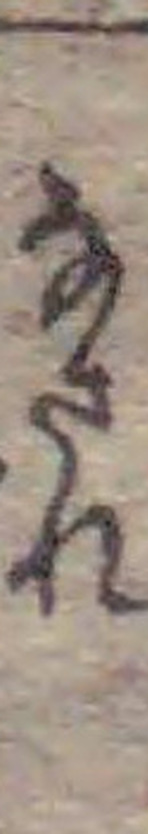なされ
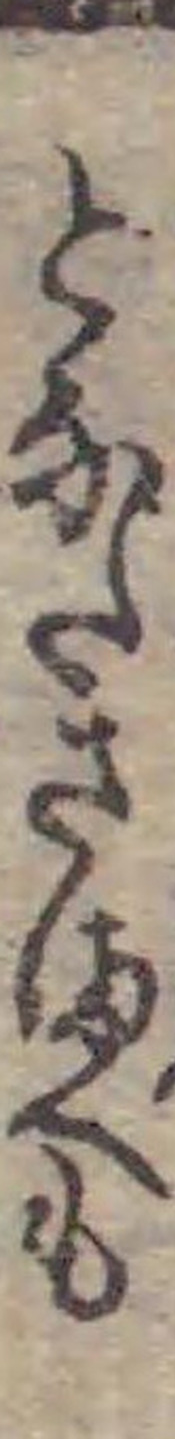となたさまへも
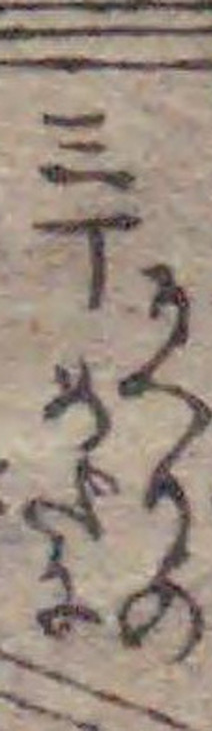三丁めだに
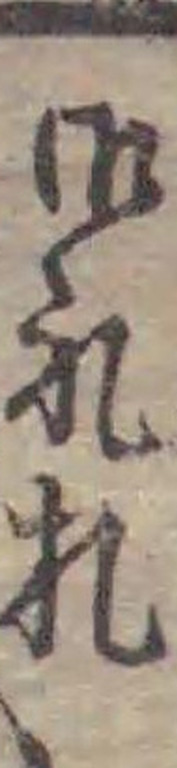御礼札
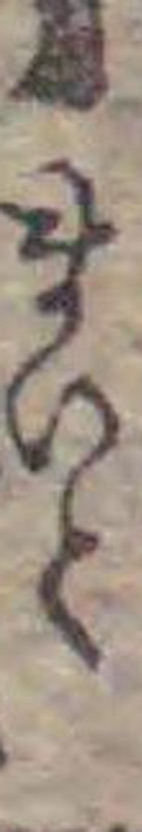まいと
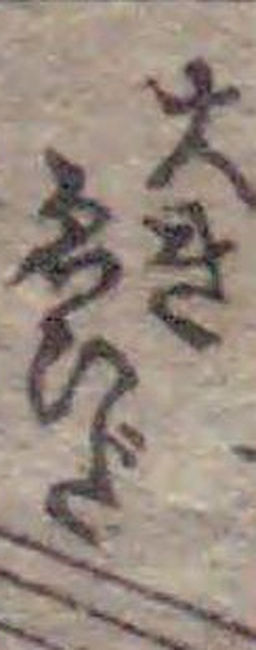ゑひだ
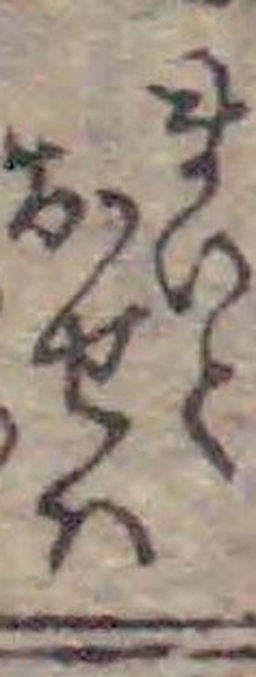おせは
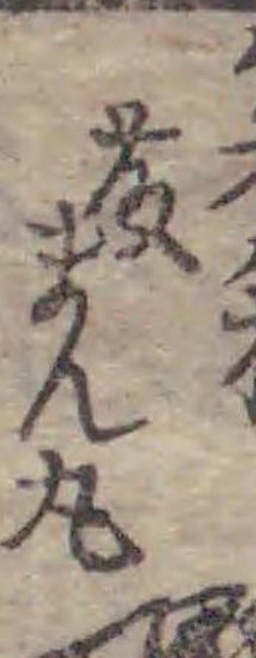まん丸
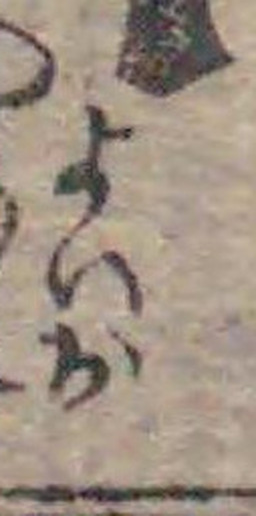よいお
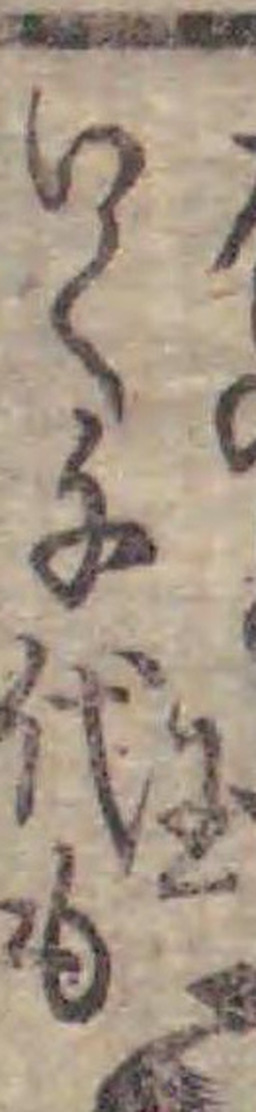いく千代も
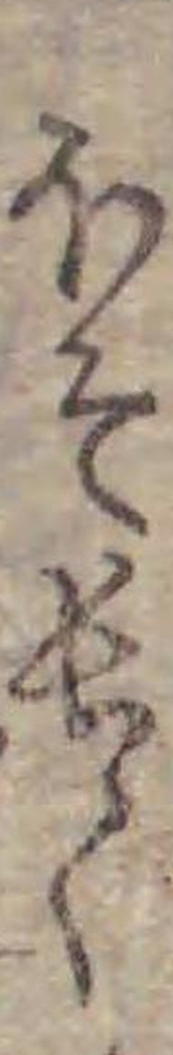ほそ長く
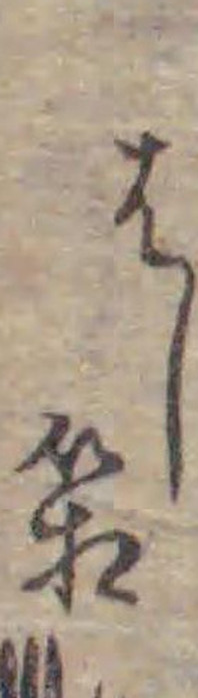はし箱

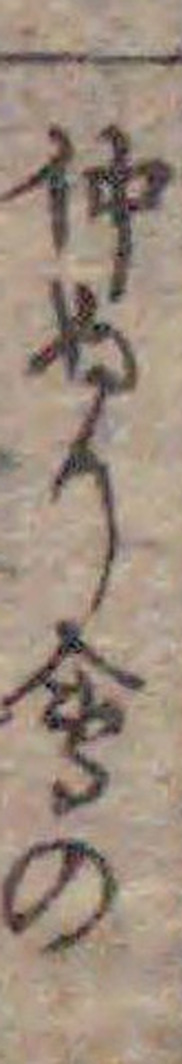仲ぬり会の
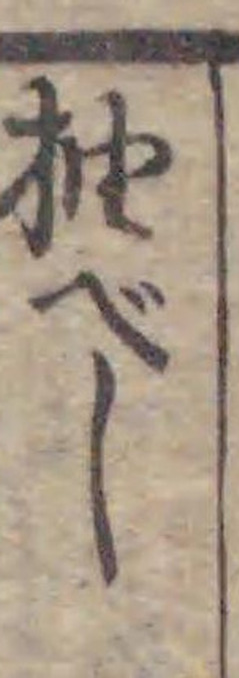柚べし
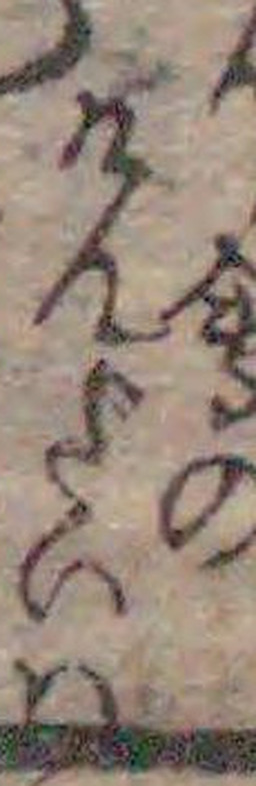けんだいは
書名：年始御礼帳 : 3巻
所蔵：国立国会図書館 National Diet Library, JAPAN
